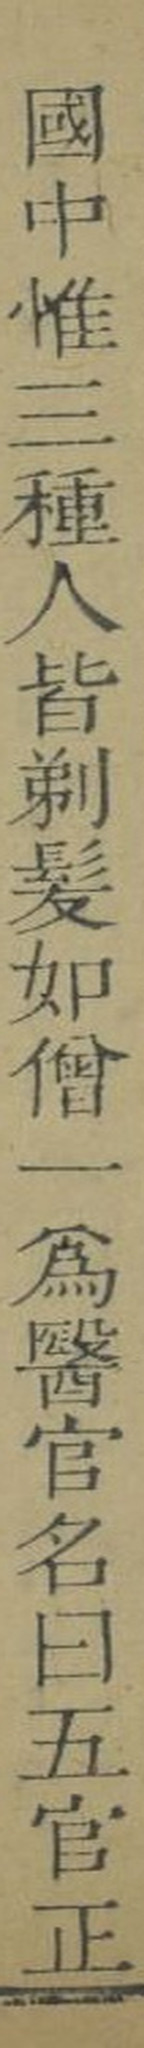国中惟三種人皆剃髪如僧一為医官名曰五官正
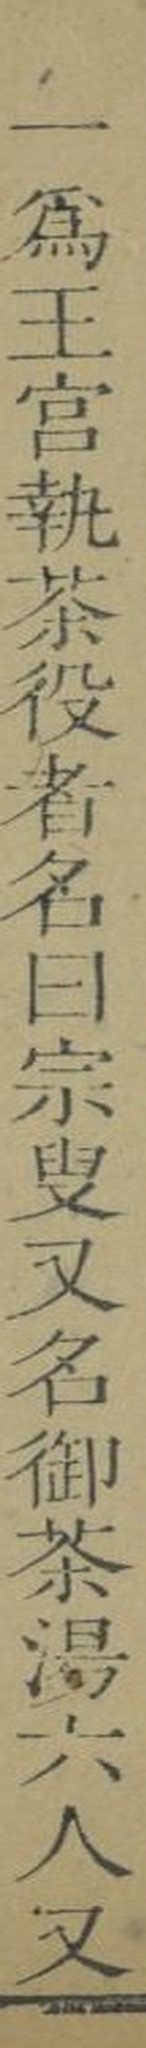一為王宮執茶役者名曰宗叟又名御茶湯六人又
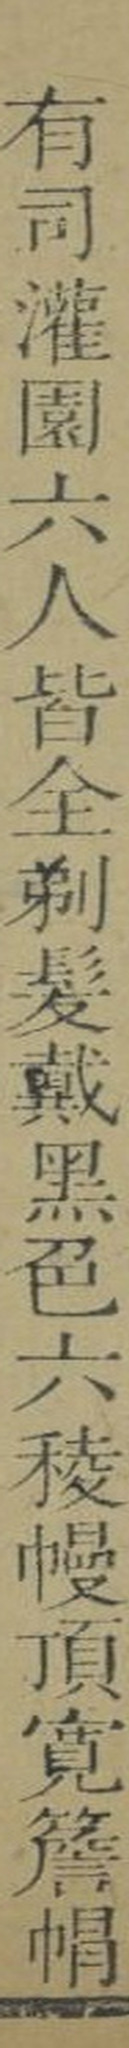有司灌園六人皆全剃髪戴黒色六稜幔頂寛簷帽
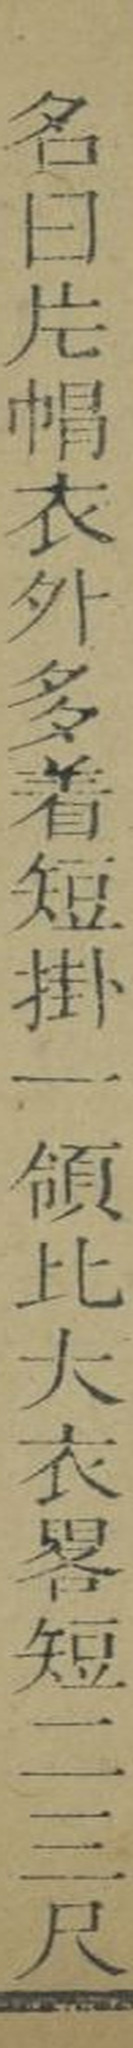名曰片帽衣外多着短掛一領比大衣略短二三尺
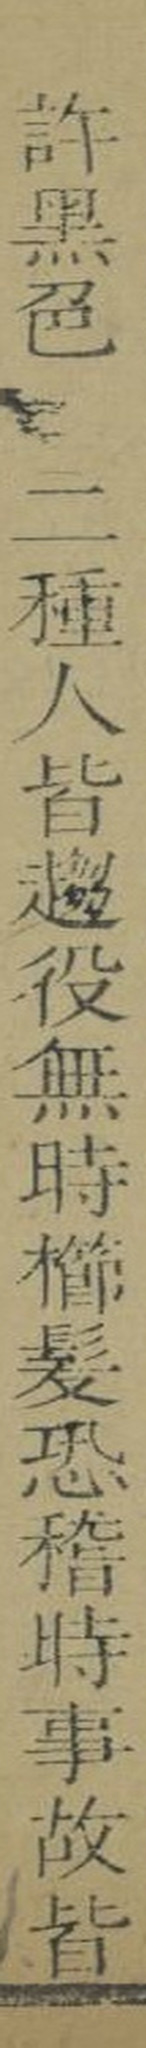許黒色二種人皆趨役無時櫛髪恐稽時事故皆
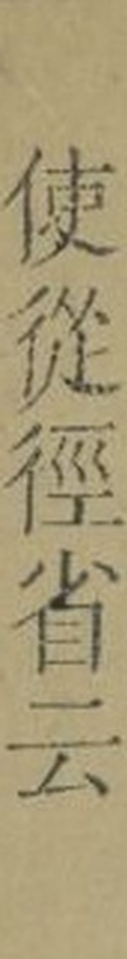使従径省云

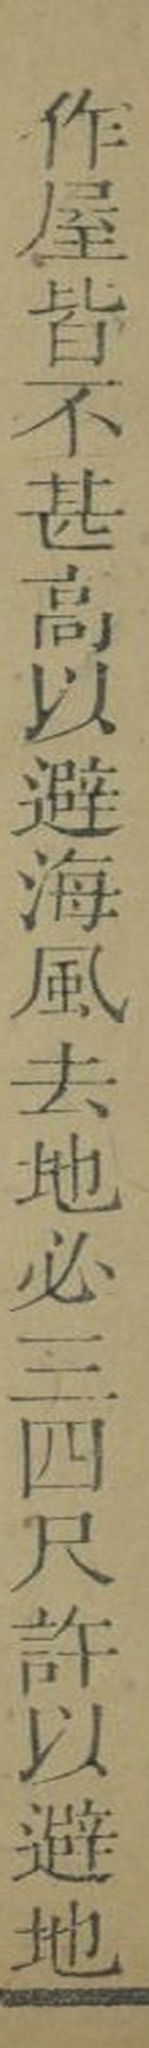作屋皆不甚高以避海風去地必三四尺許以避地
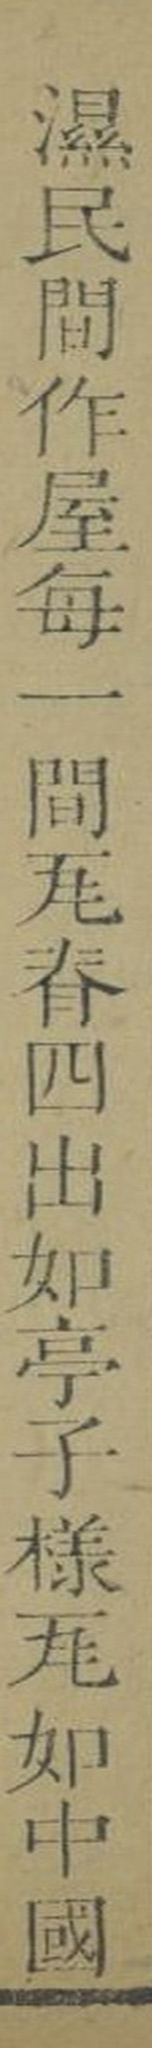湿民間作屋毎一間瓦脊四出如亭子様瓦如中国
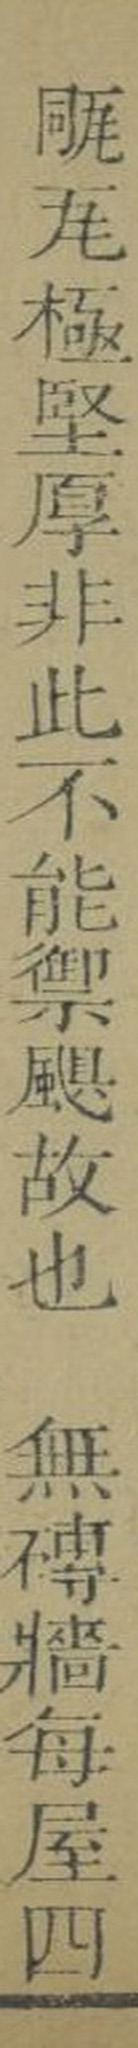瓦極堅厚非此不能禦颶故也無磚牆毎屋四
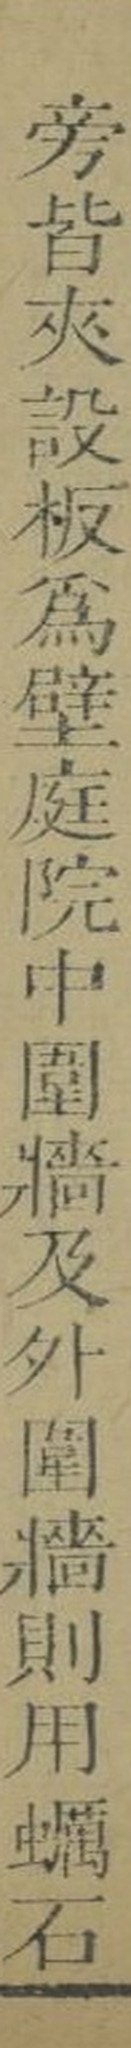旁皆夾設板為壁庭院中囲牆及外囲牆則用蠣石
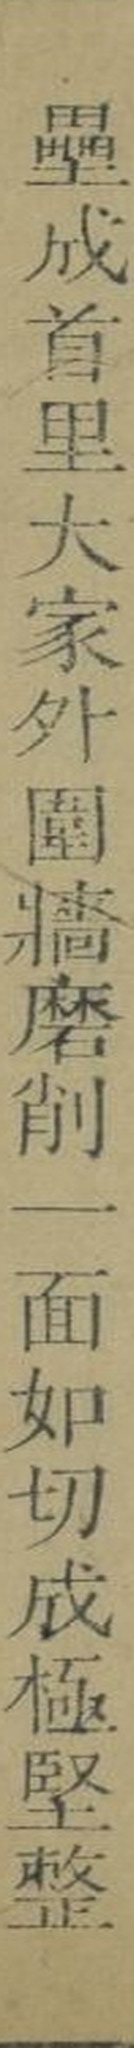壘成首里大家外囲牆磨削一面如切成極堅整
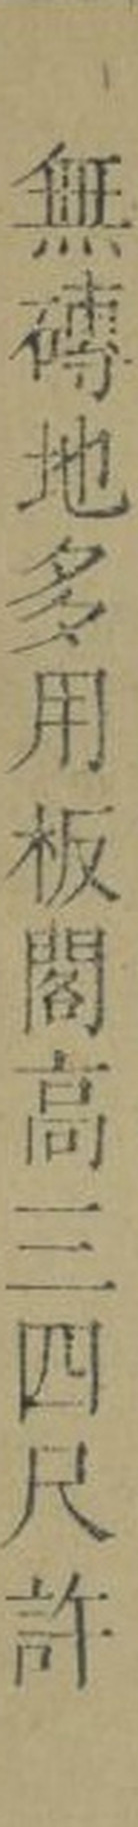無磚地多用板閣高三四尺許
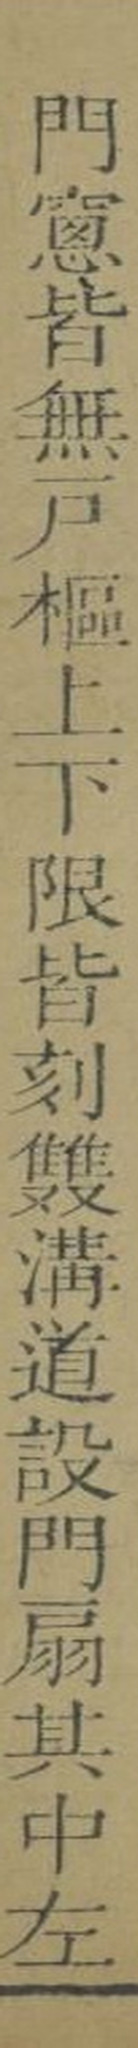門窓皆無戸枢上下限皆刻双溝道設門扇其中左
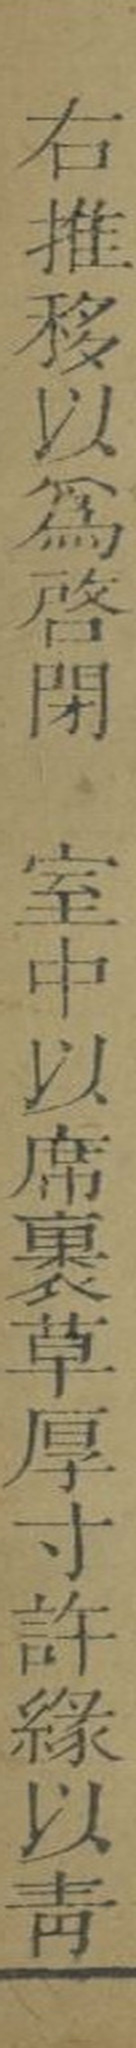右推移以為啓閉室中以席裹草厚寸許縁以青

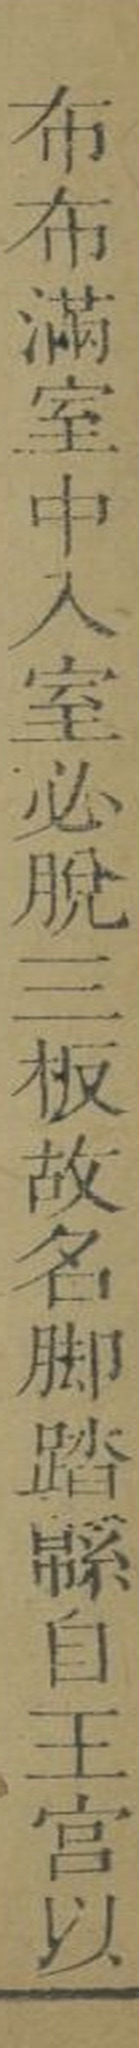布布満室中入室必脱三板故名脚踏綿自王宮以
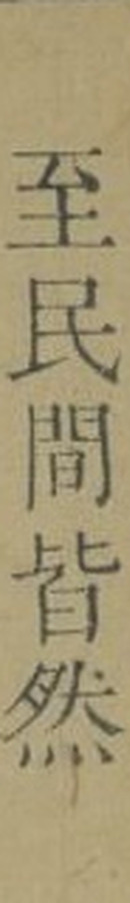至民間皆然
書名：中山伝信録 巻六
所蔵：University of the Ryukyus Library
